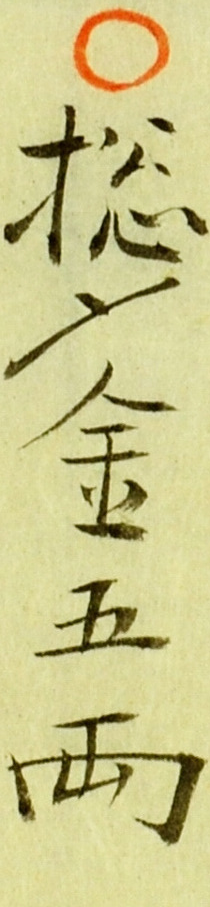〇総〆金五両
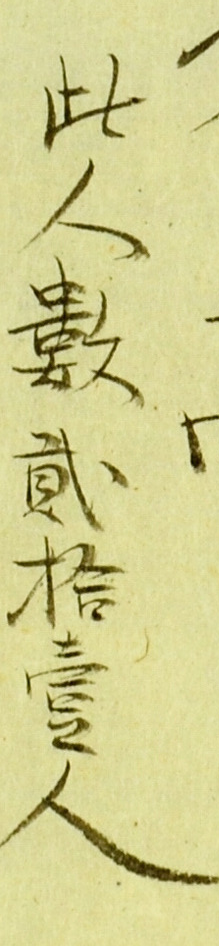此人数弐拾壱人
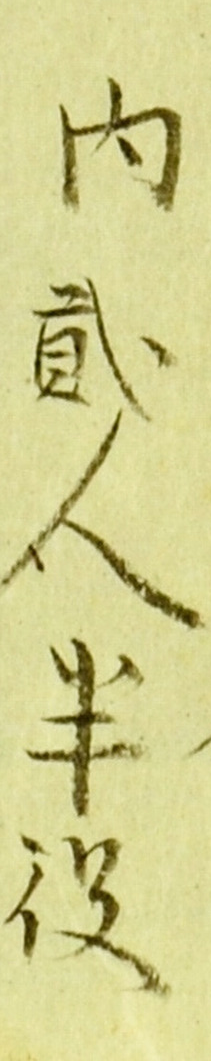内弐人半役
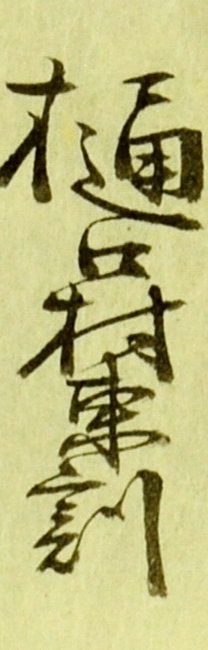樋口村東割
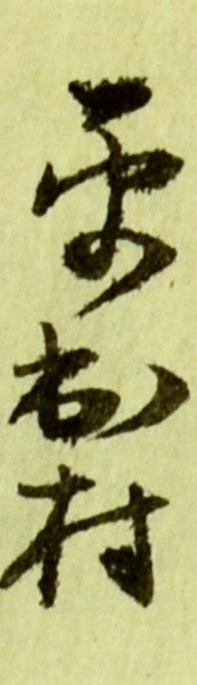平出村

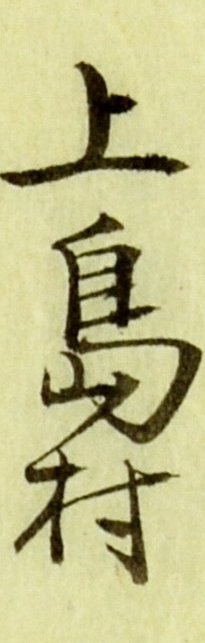上島村
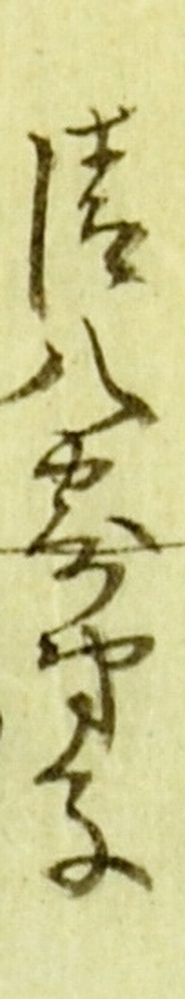清八寄弟子
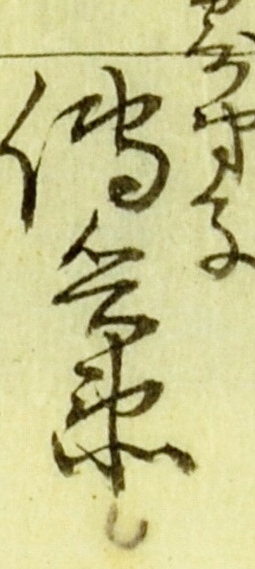伝兵衛
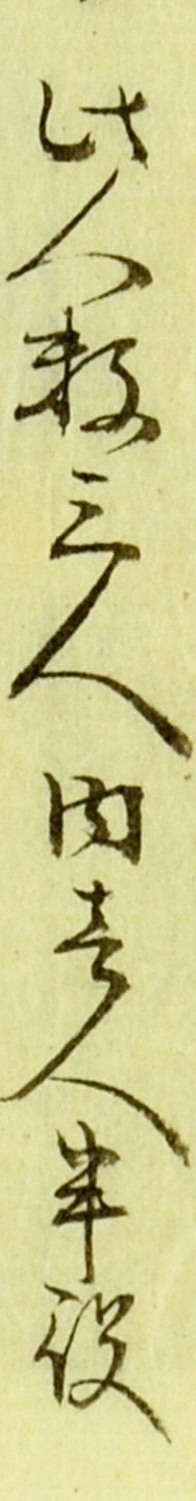此人数三人内壱人半役
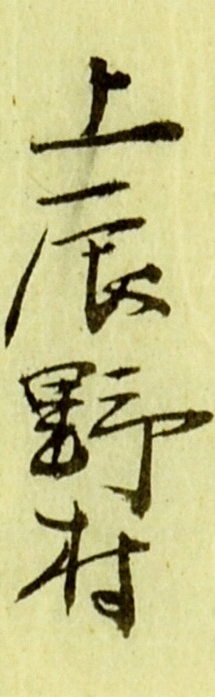上辰野村
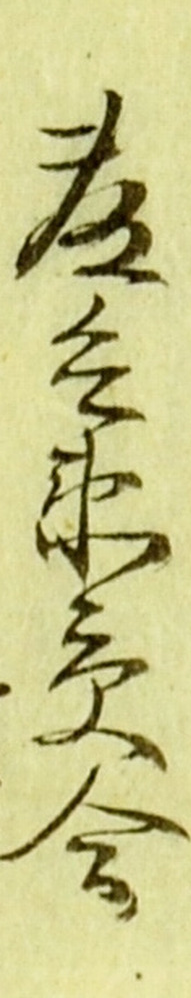藤兵衛受合
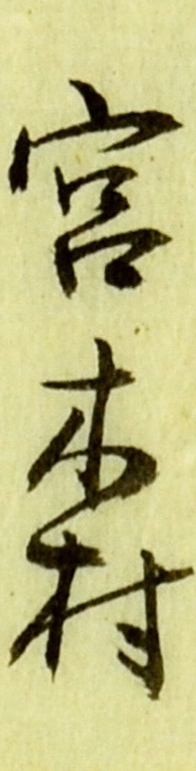宮木村
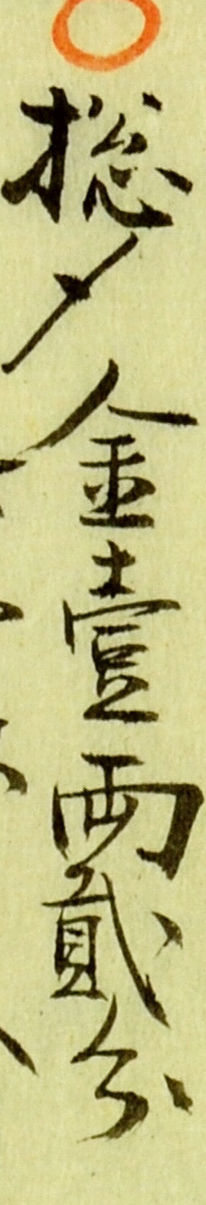〇総〆金壱両弐分
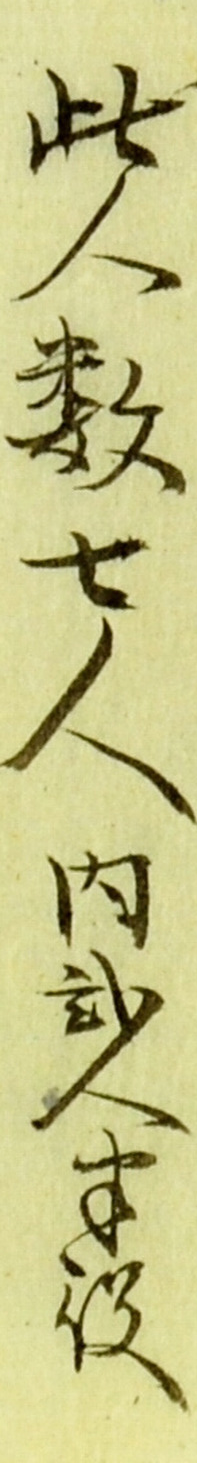此人数七人内弐人半役
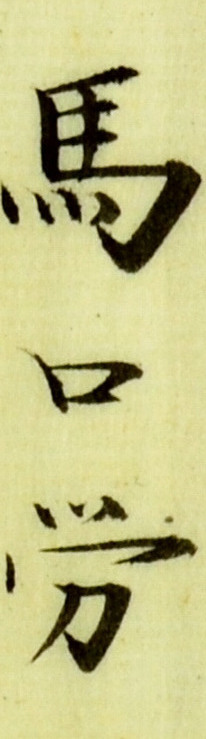馬口労

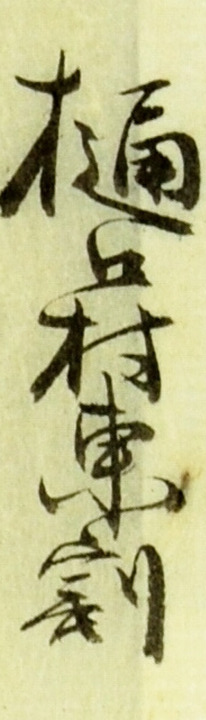樋口村東割
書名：上伊那郷諸運上取調帳
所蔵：伊那市立高遠町図書館・合同会社AMANE
